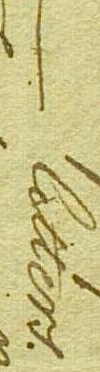–––– letters.
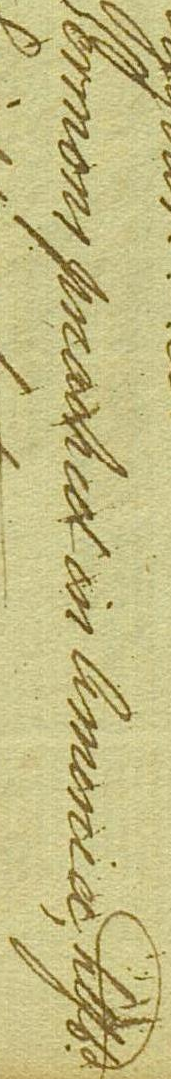Sermons preached in America, hist^d.
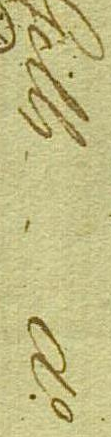Gills . . d^o.
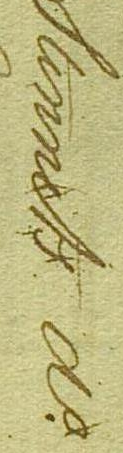Stinnets d^o.
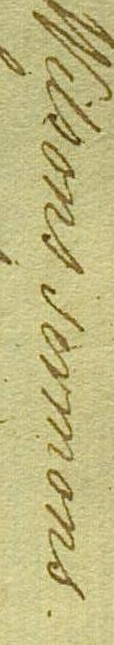Wilsons sermons.
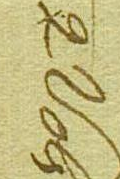2 Vols.
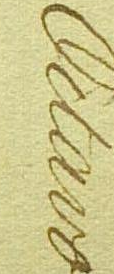Octavo
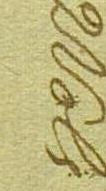2 Vols
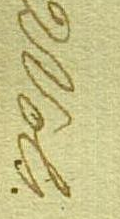2 Vols.
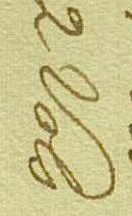2 Vols
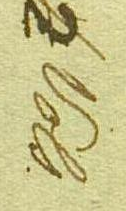2 Vols.
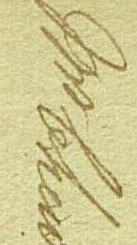M^r Chew.
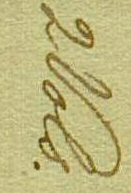2 Vols.
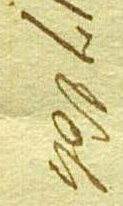17 Vols
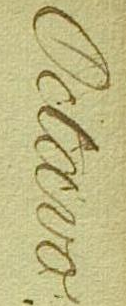Octavo.
